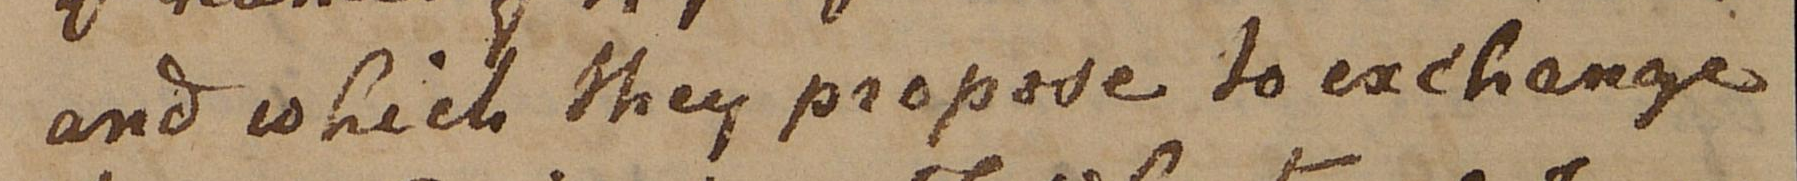and which they propose to exchange
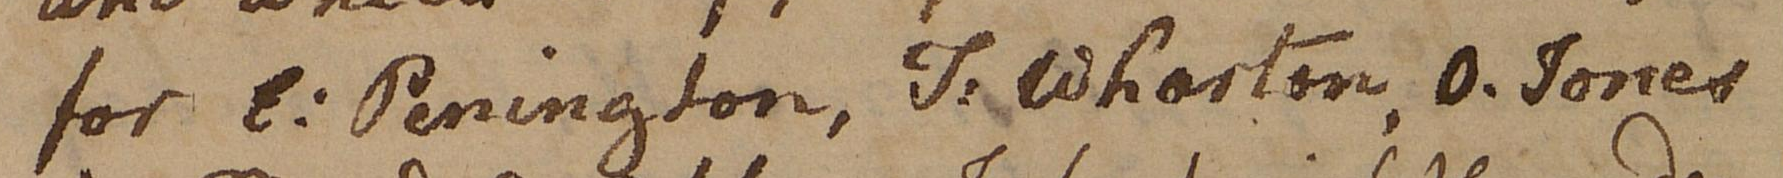for E: Penington, T. Wharton, O. Jones
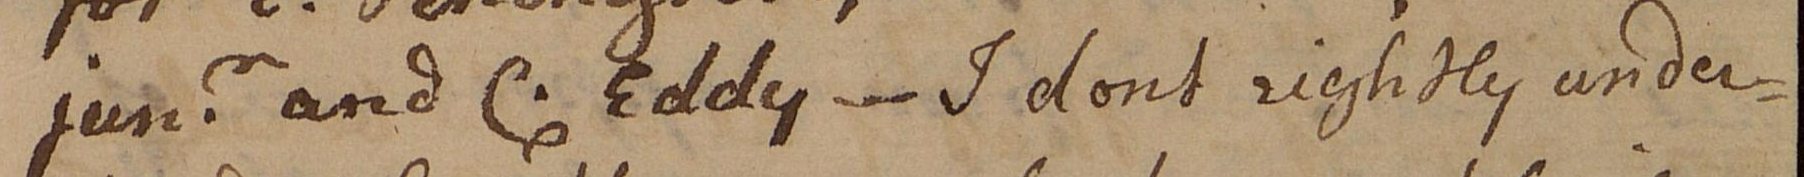jun^r. and C. Eddy- I dont rightly under-
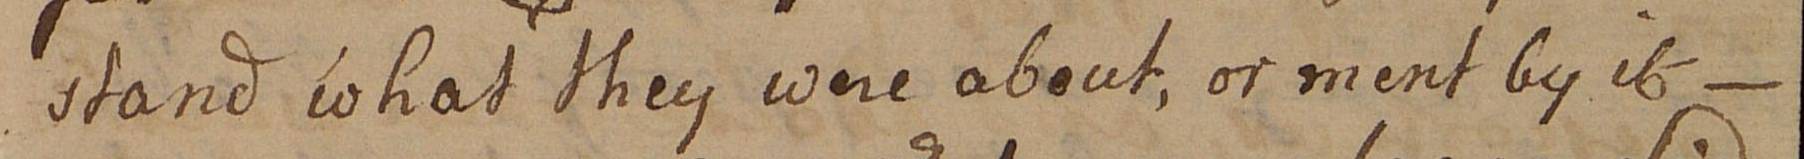stand what they were about, or ment by it-
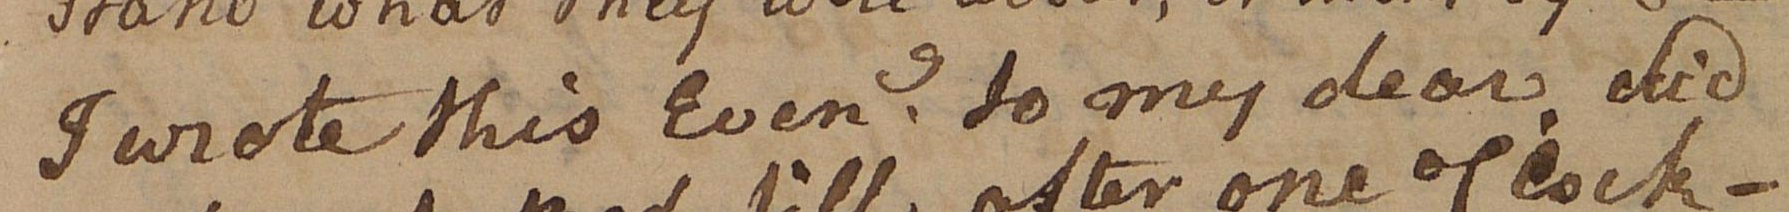I wrote this Even^g to my dear, did
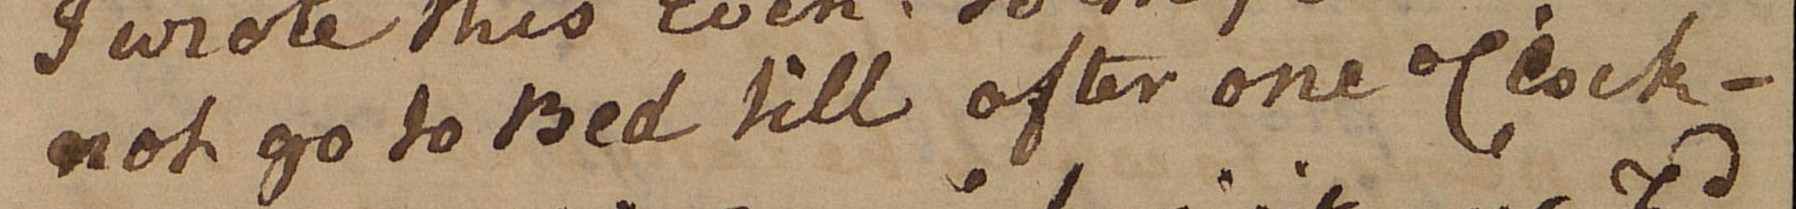not go to Bed till after one ^o Clock-
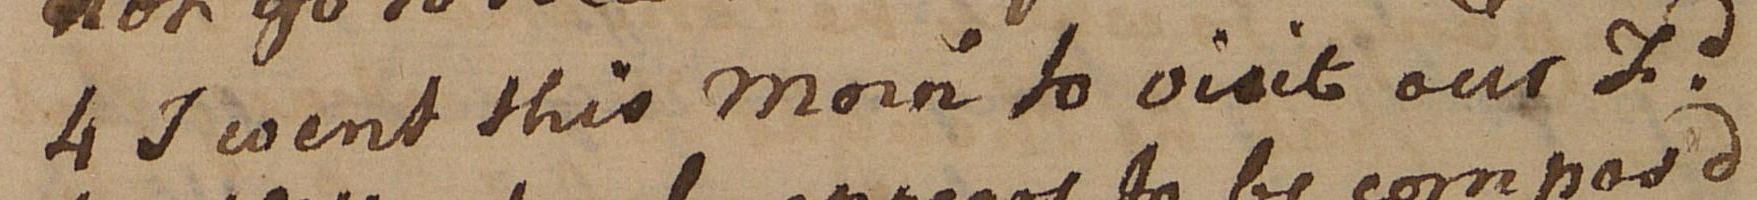4 I went this morn^g to visit our F^d
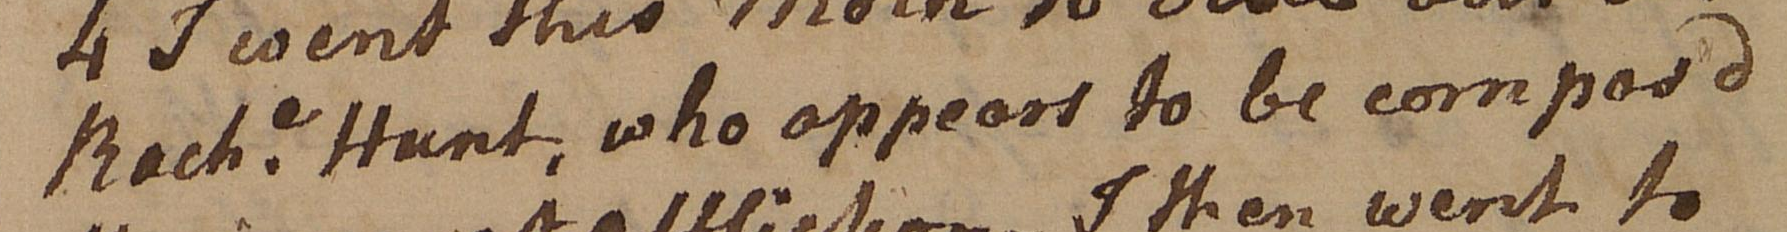Rach^l. Hunt, who appears to be compos'd
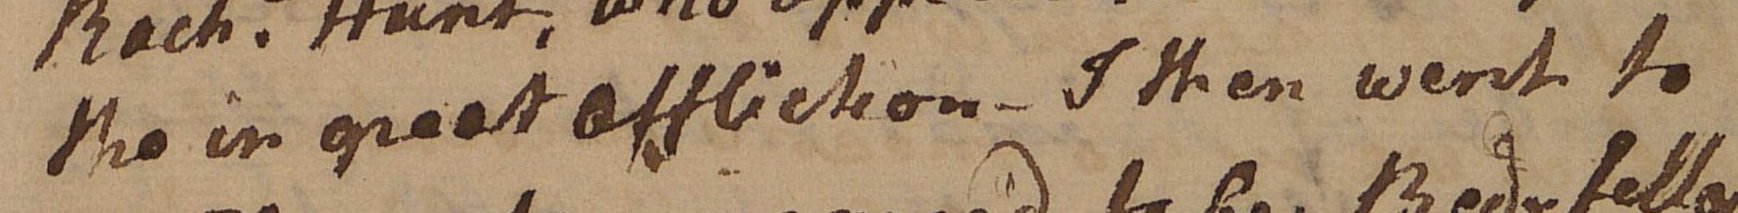tho in great affliction- I then went to
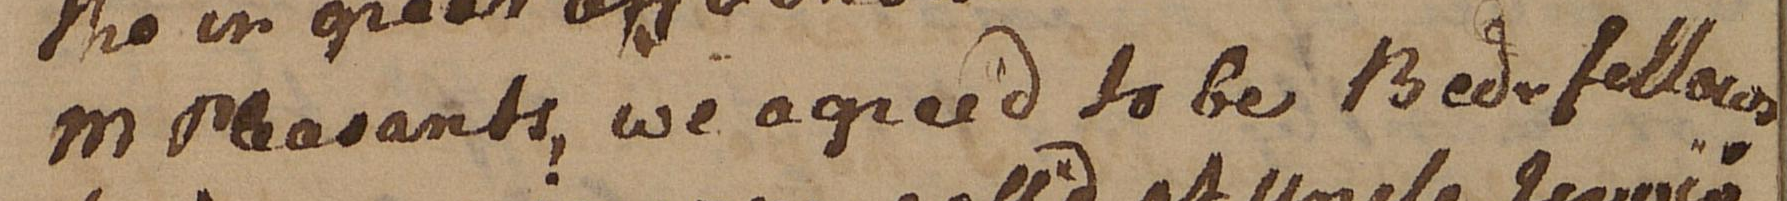M Pleasants, we agreed to be Bedfellows
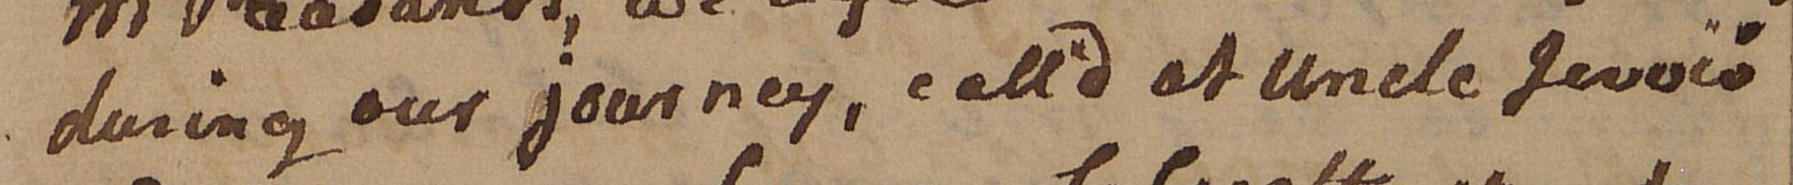during our journey, call'd at Uncle Jervis'
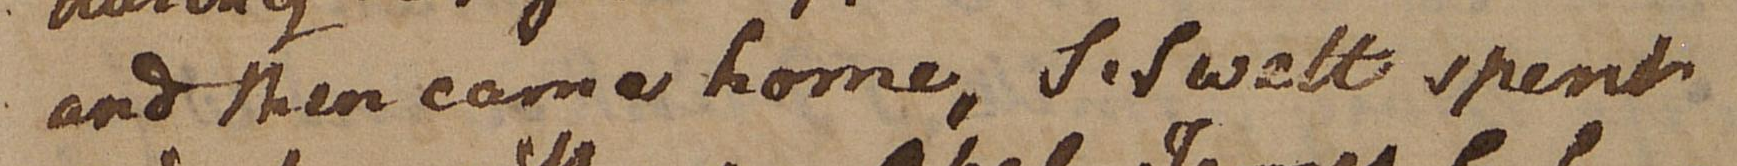and then came home, S. Swett spent
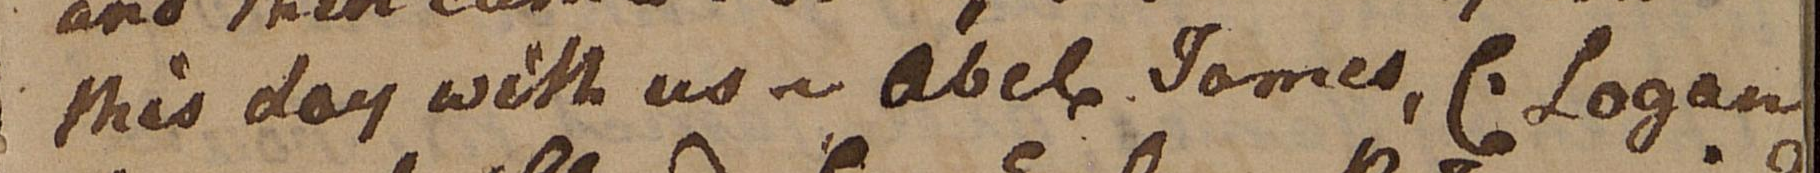this day with us- Abel James, C. Logan
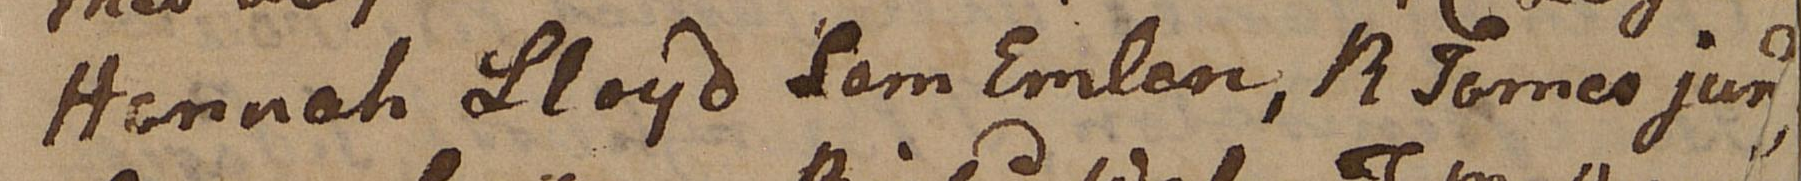Hannah Lloyd Sam Emlen, R James jun^r
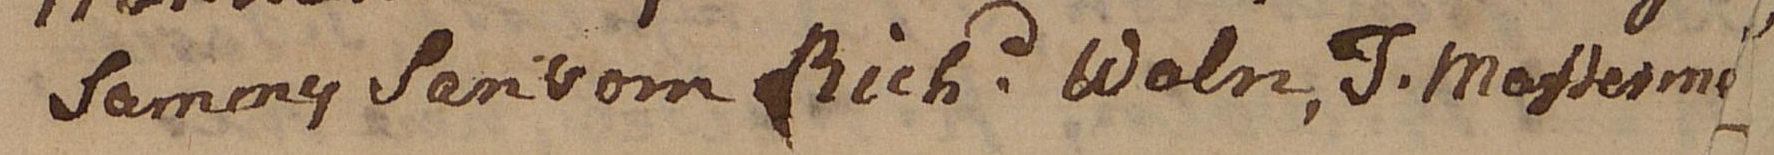Sammy Sansom Rich^d. Waln, J. Masterm
